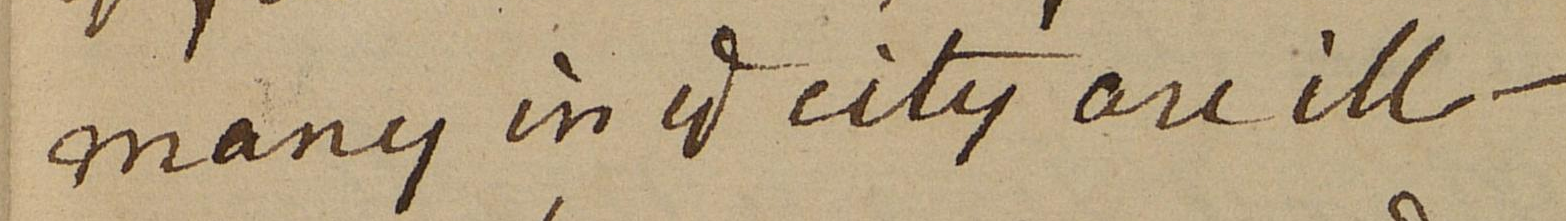many in y^e city are ill
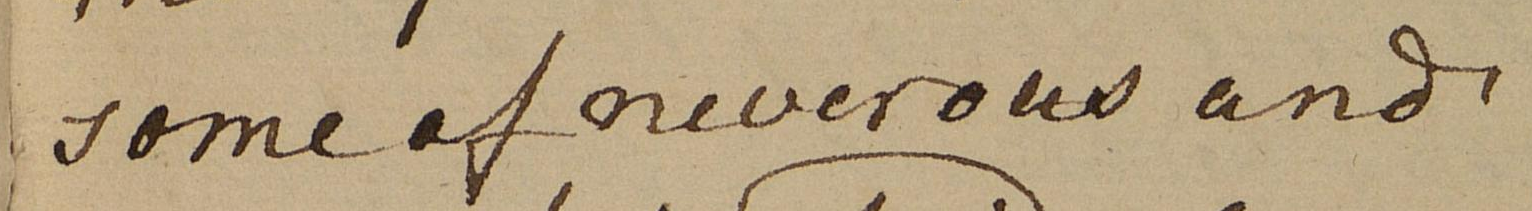some of neverous and
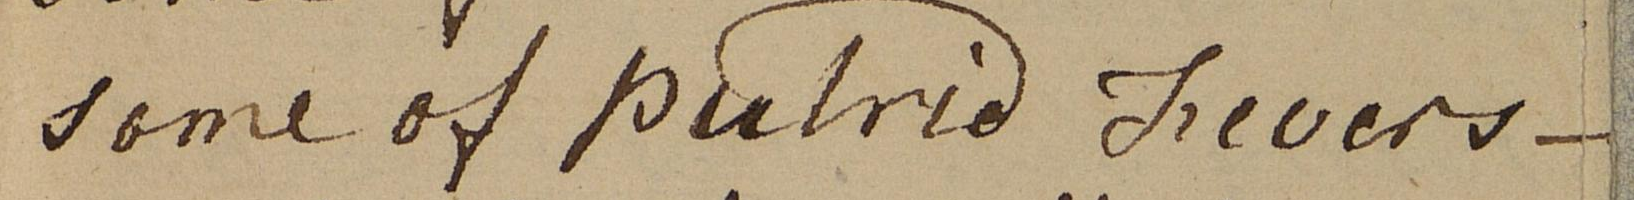some of putrid Fevers-
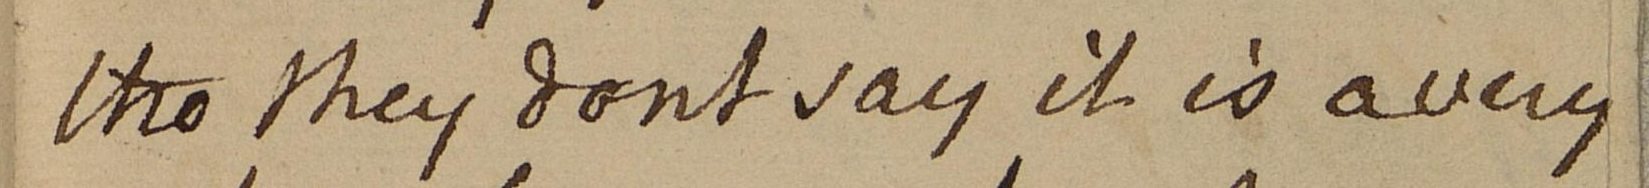tho they dont say it is a very
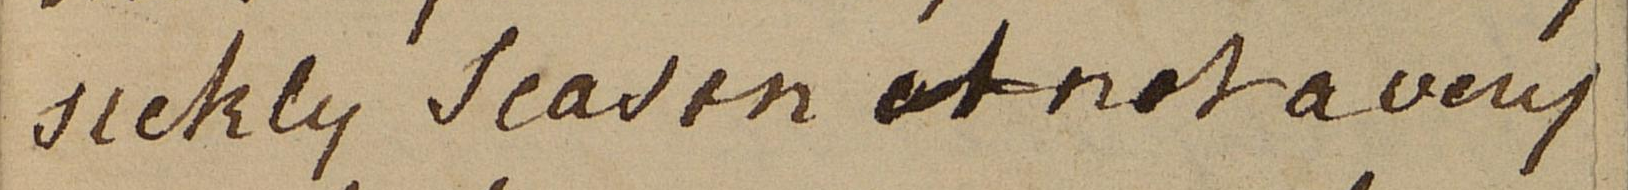sickly season at not a very
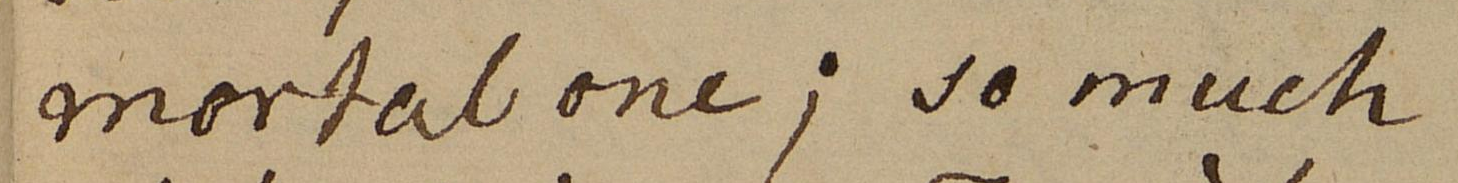mortal one; so much
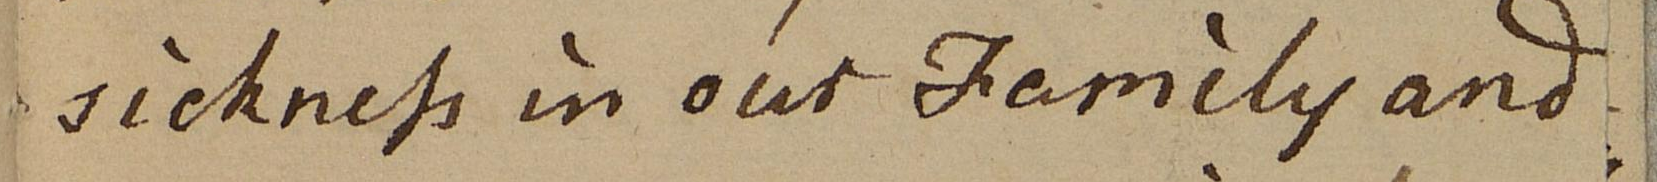sickness in out Family and
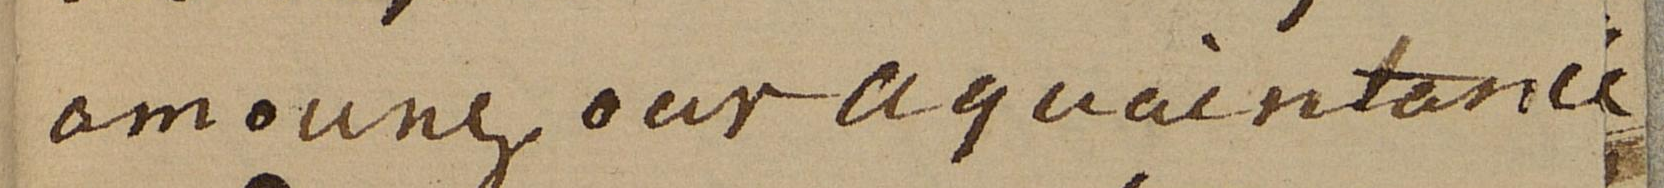amoung our aquaintance
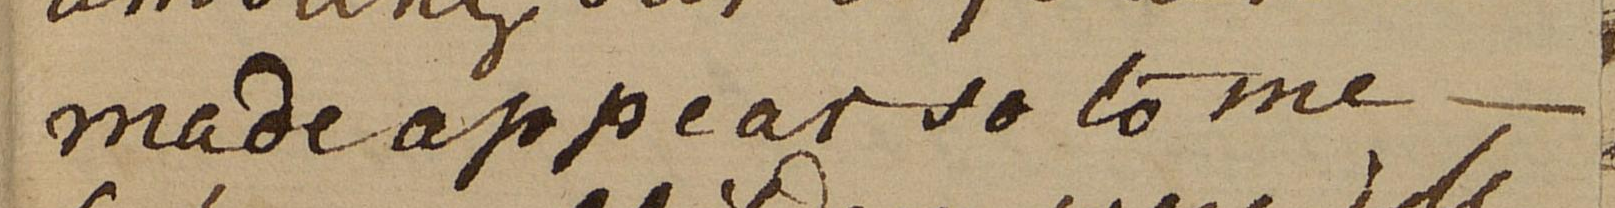made appear so to me-
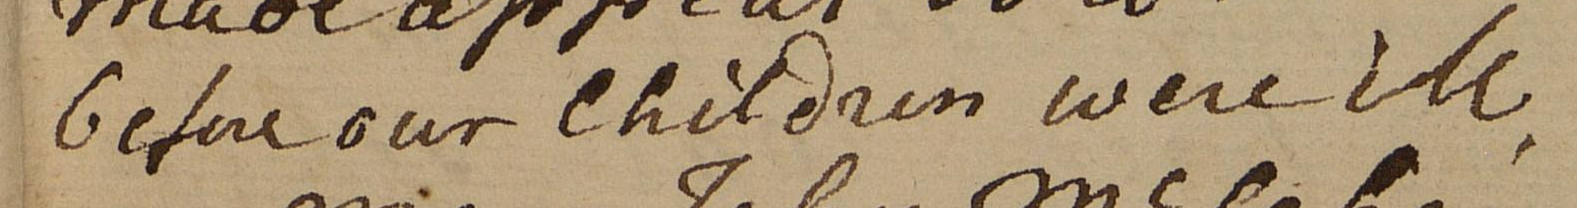before our Children were ill
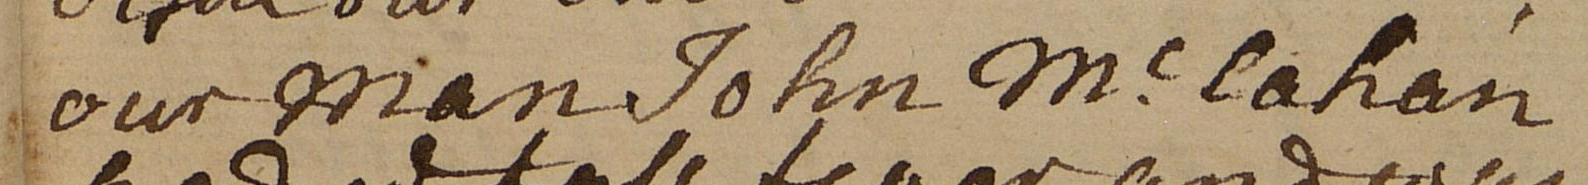our Man John M^c Cahan
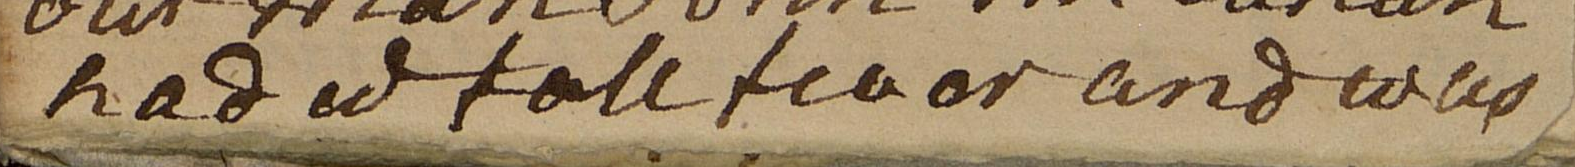had y^e fall fever and was
